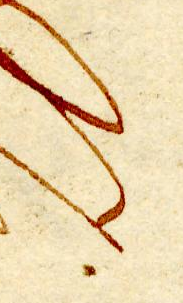20
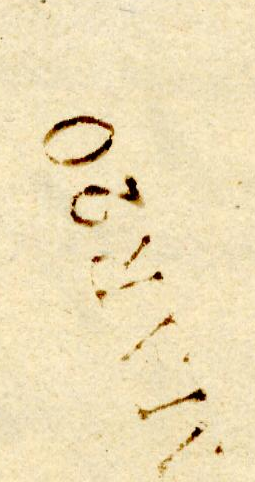MAR20
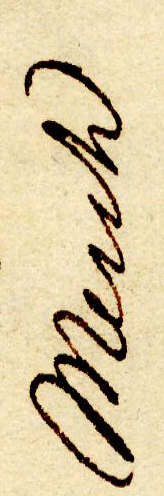Merch
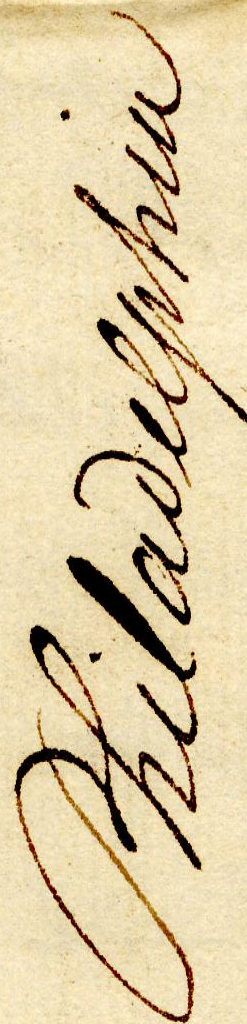Philadelphia
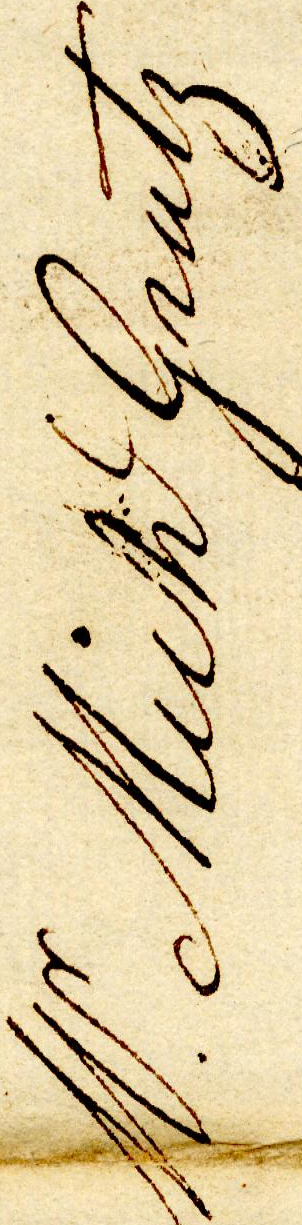M^r Mich^l Gratz
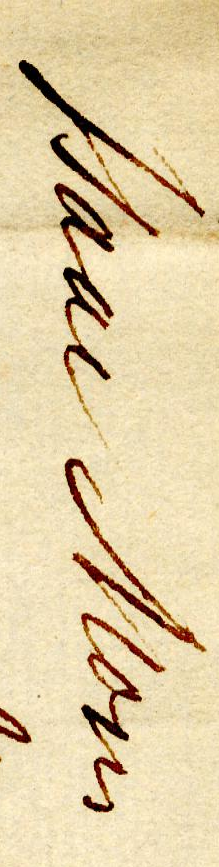Isaac Moses
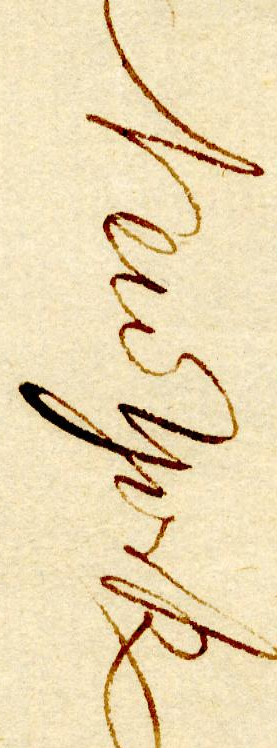New York
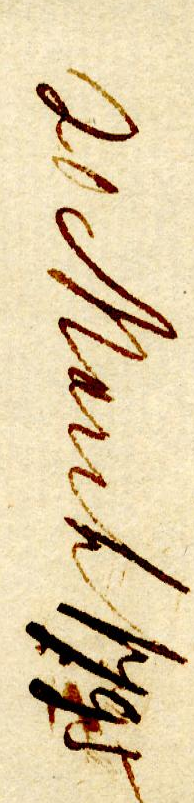20 March 1795
